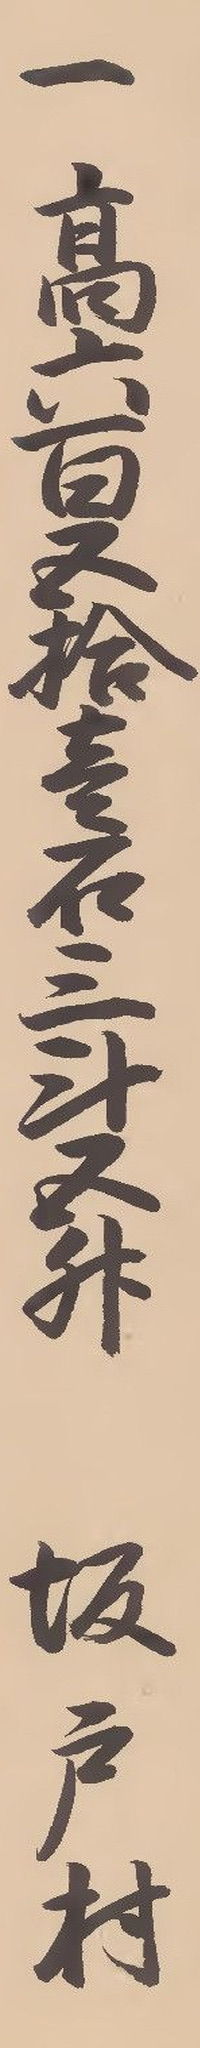一高六百五拾壱石三斗五升坂戸村
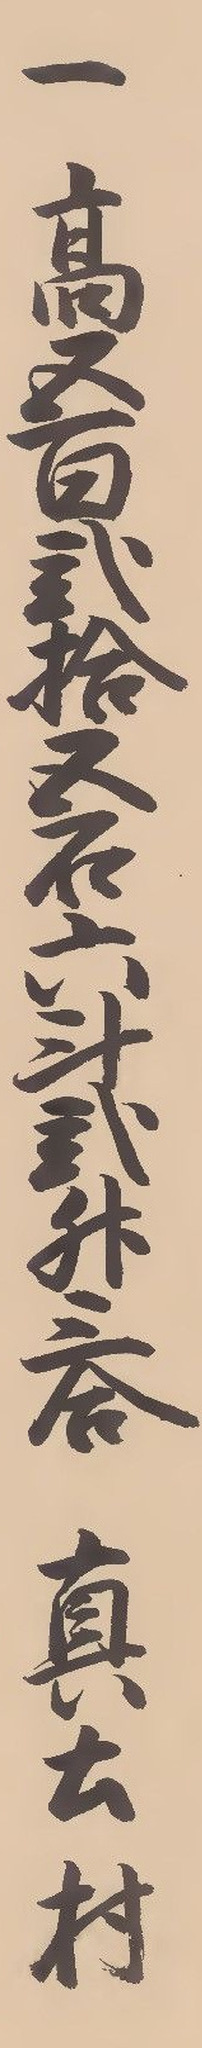一高五百弐拾五石六斗弐升三合真土村
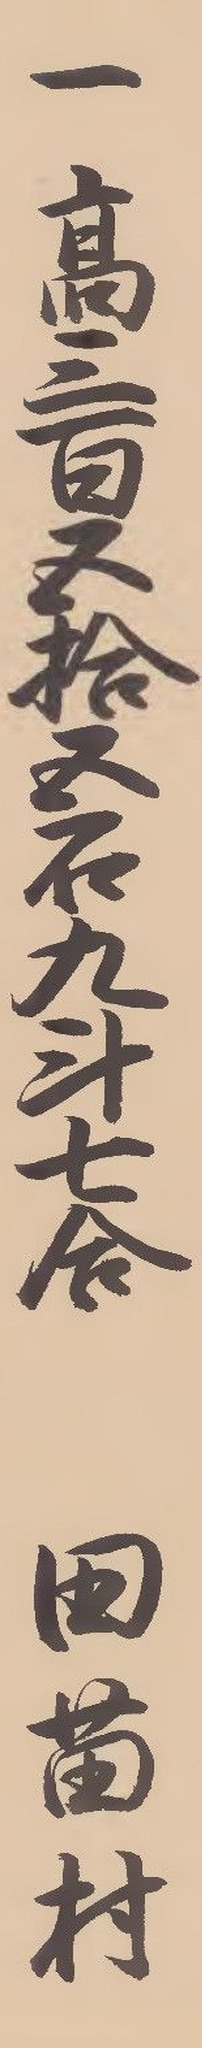一高三百五拾五石九斗七合田苗村
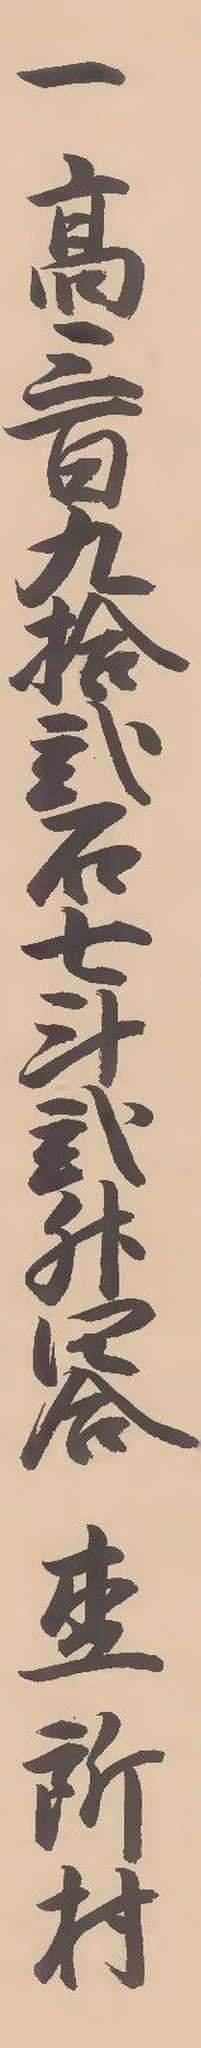一高三百九拾弐石七斗弐升四合杢所村

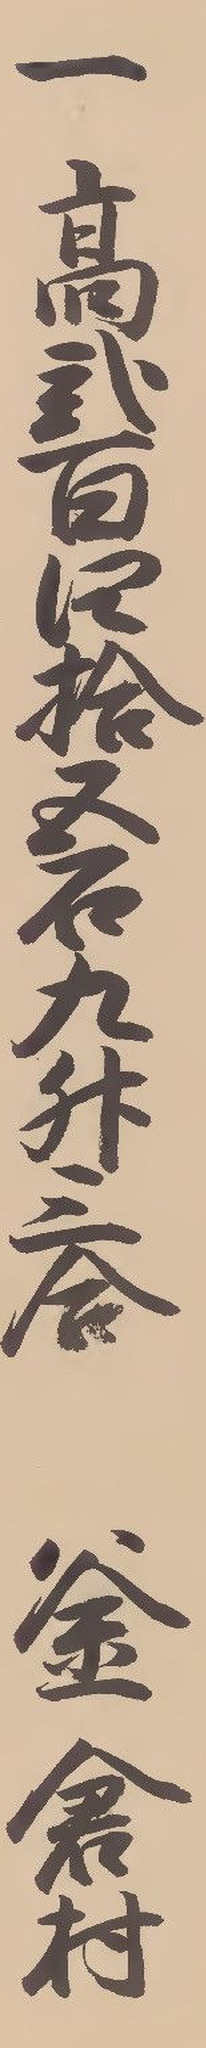一高弐百四拾五石九升三合釜倉村
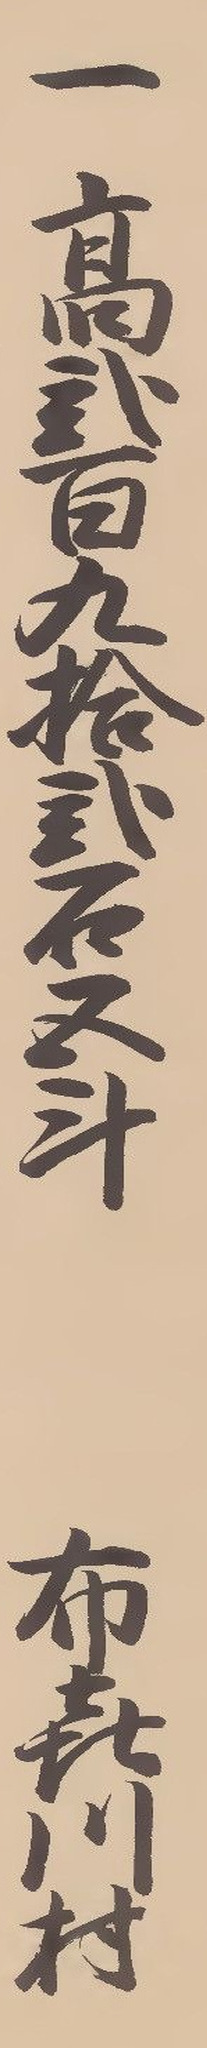一高弐百九拾弐石五斗布喜川村
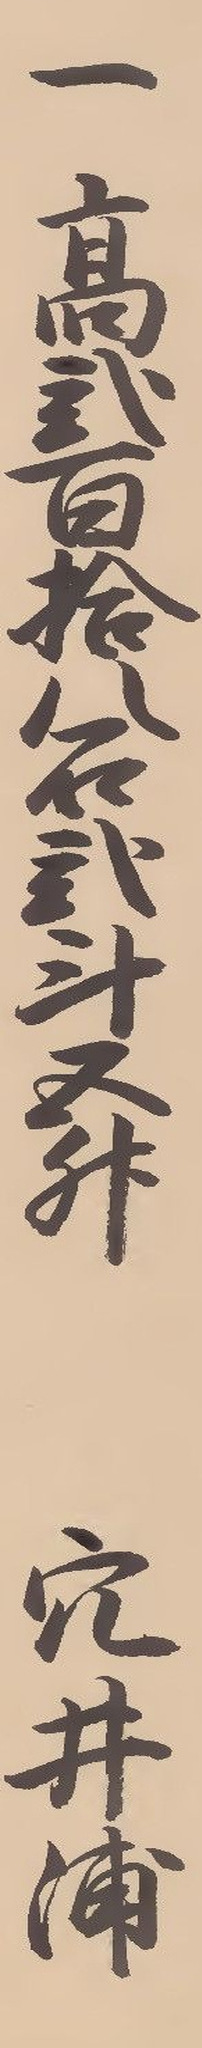一高弐百拾八石弐斗五升穴井浦
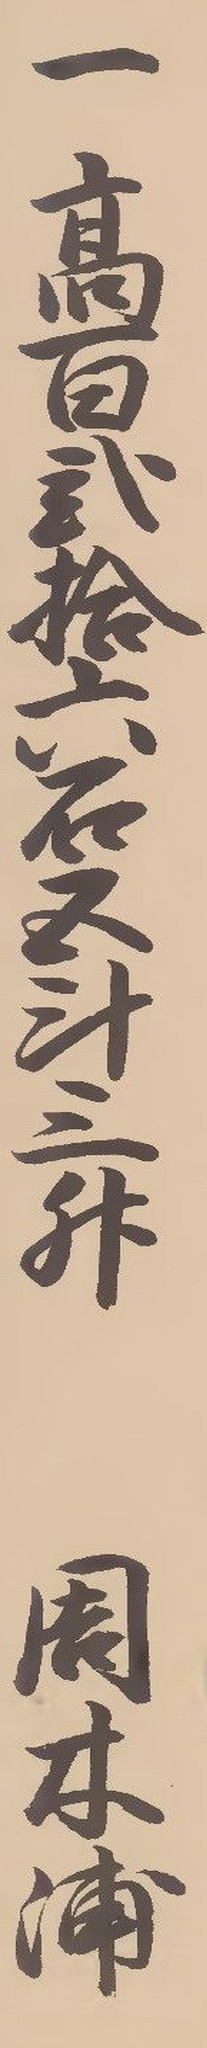一高百弐拾六石五斗三升周木浦
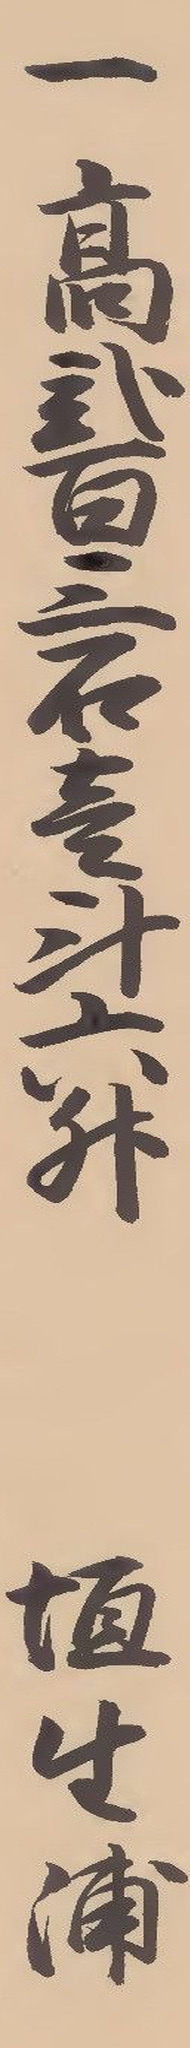一高弐百三石壱斗六升垣生浦
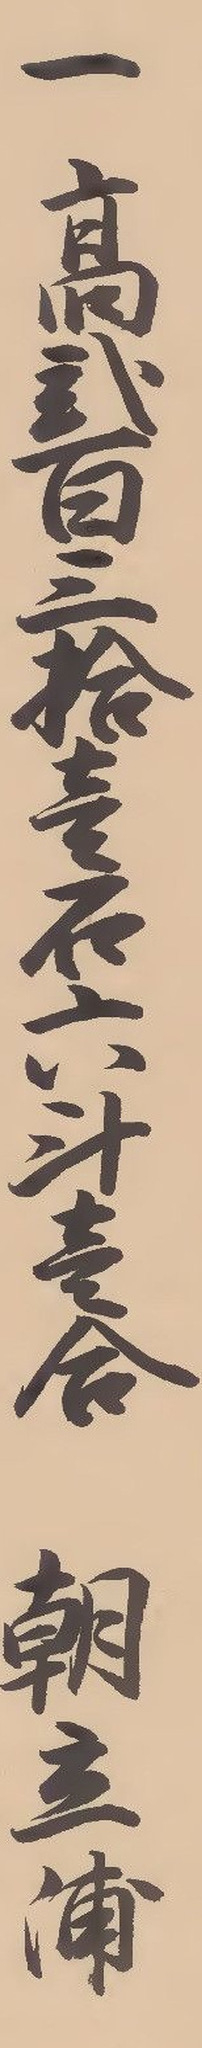一高弐百三拾壱石六斗壱合朝立浦

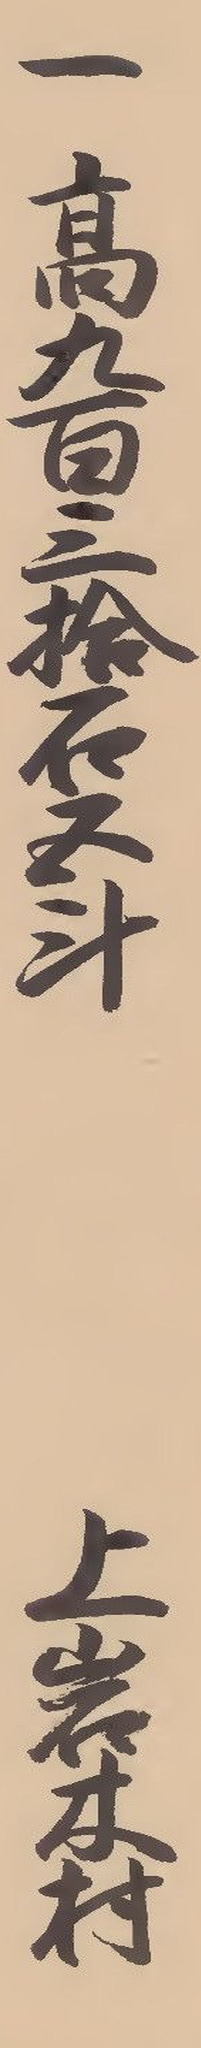一高九百三拾石五斗上岩木村
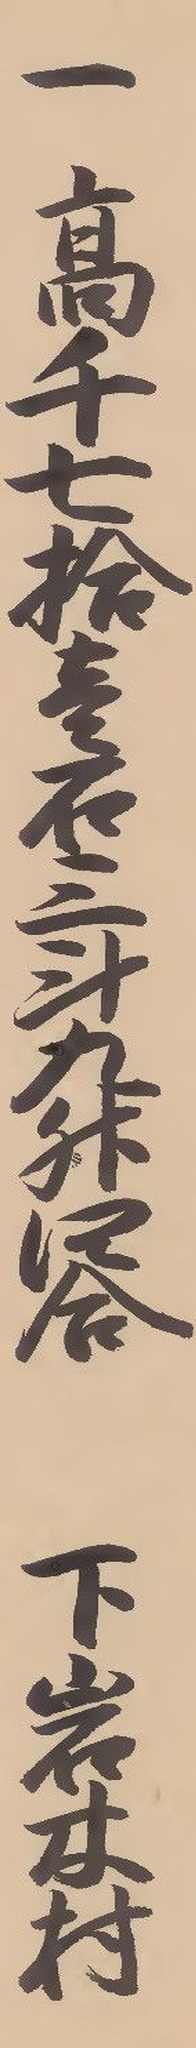一高千七拾壱石三斗九升四合下岩木村
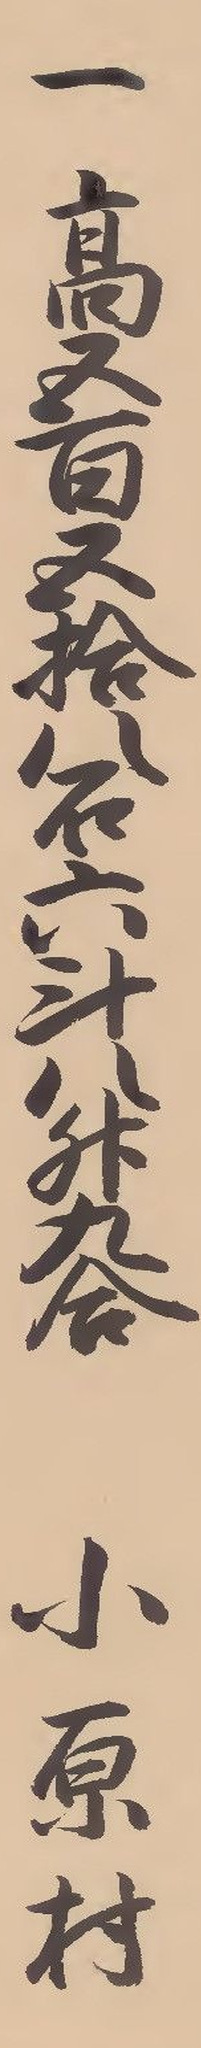一高五百五拾八石六斗八升九合小原村
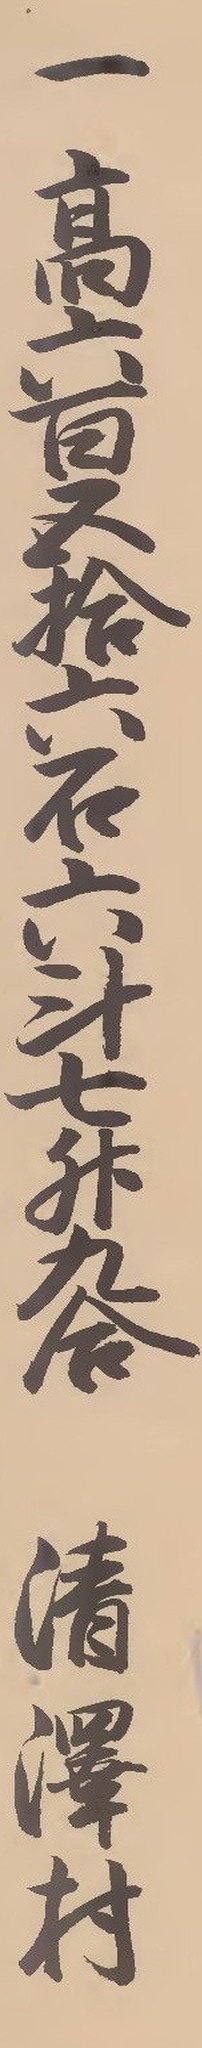一高六百五拾六石六斗七升九合清沢村
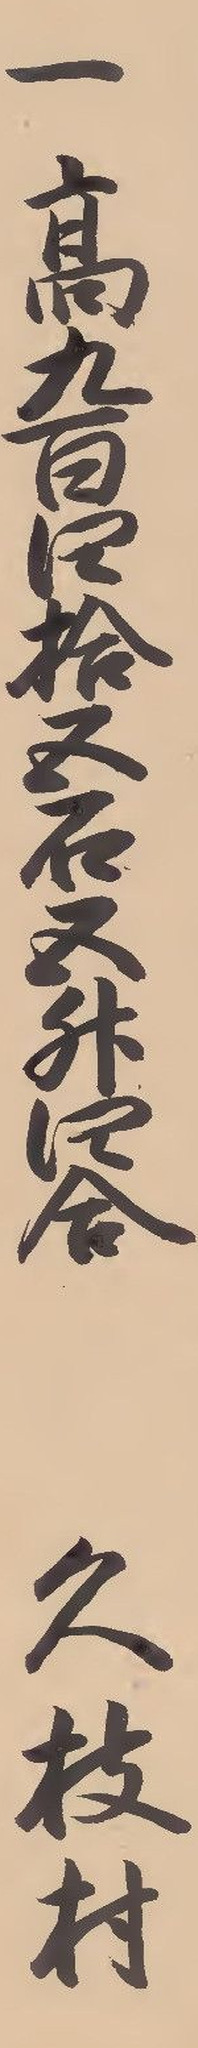一高九百四拾五石五升四合久枝村
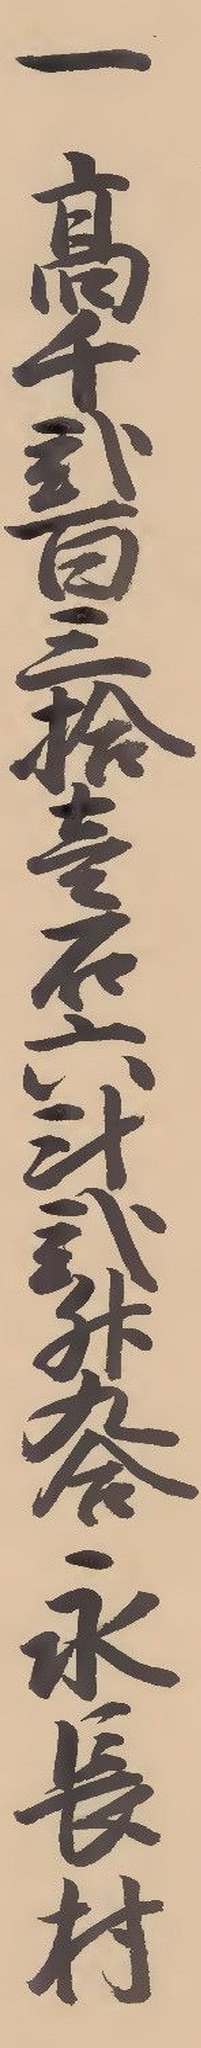一高千弐百三拾壱石六斗弐升九合永長村
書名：伊予国郷帳
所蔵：国立公文書館 National Archives of Japan
